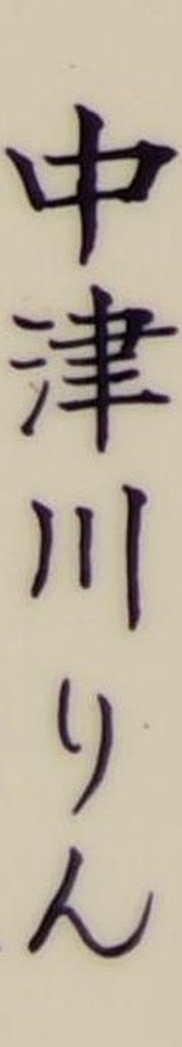中津川りん
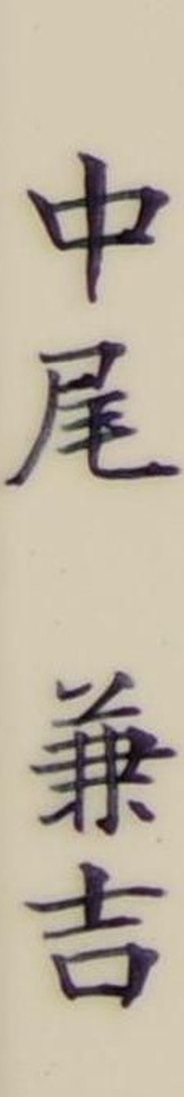中尾兼吉

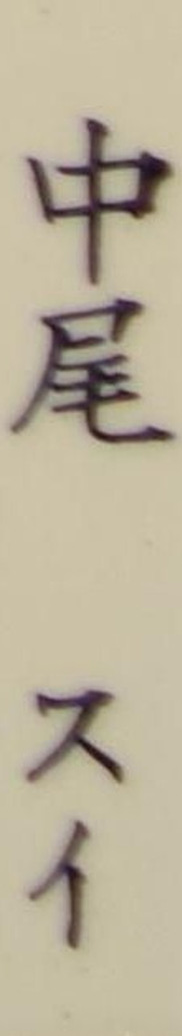中尾スイ
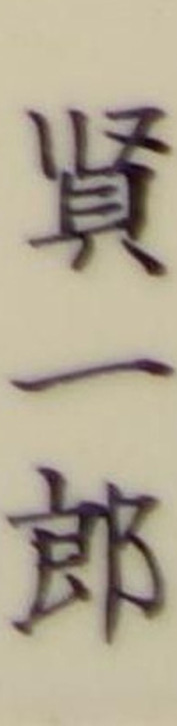賢一郎
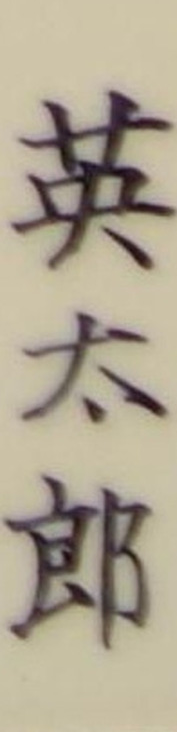英太郎
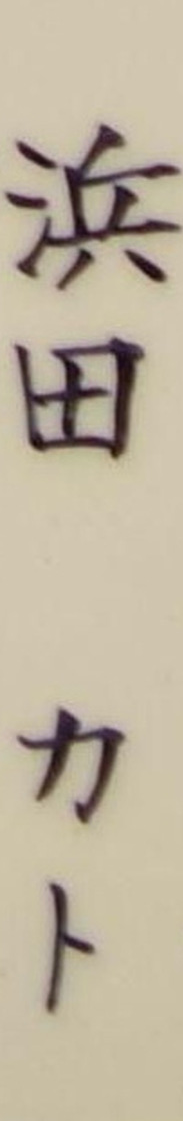浜田カト
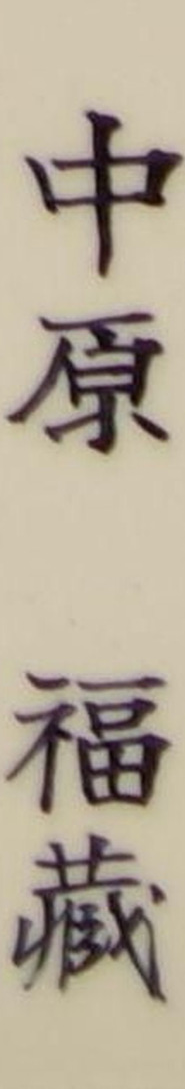中原福蔵
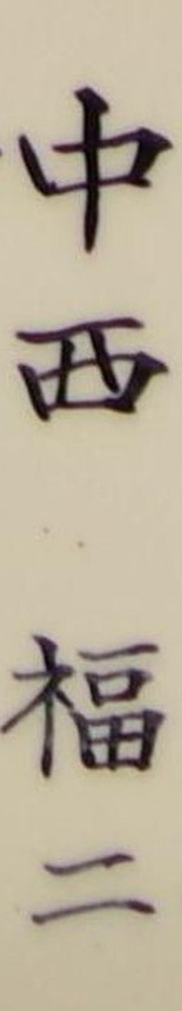中西福二
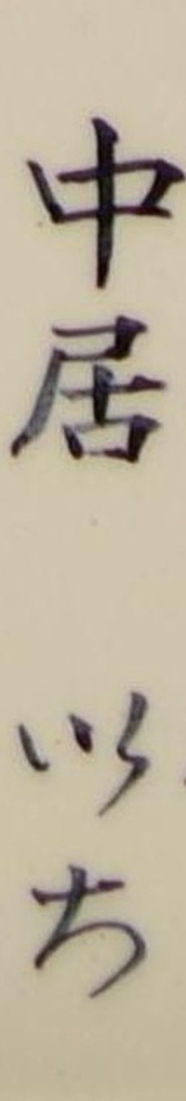中居いち
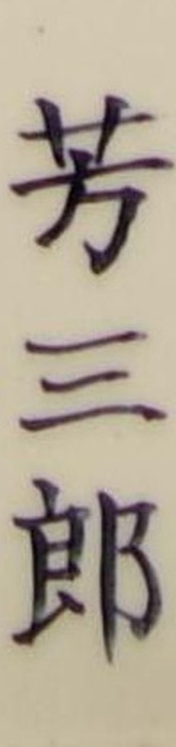芳三郎
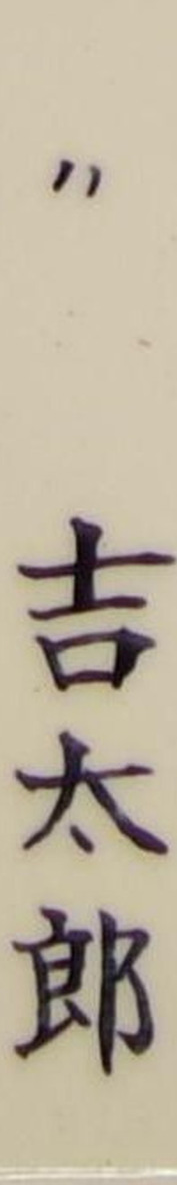吉太郎
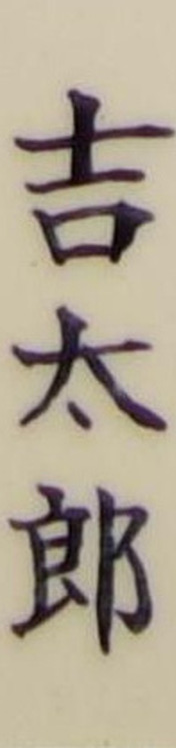吉太郎
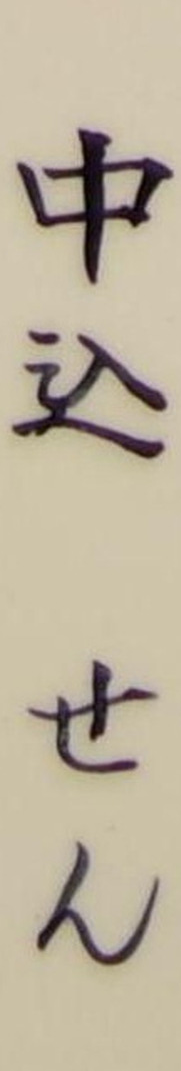中込せん
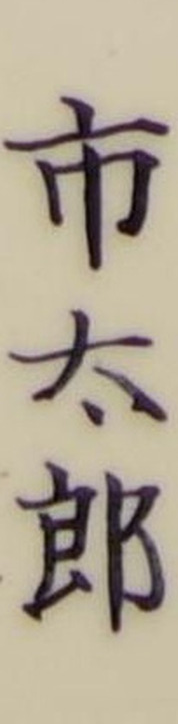市太郎
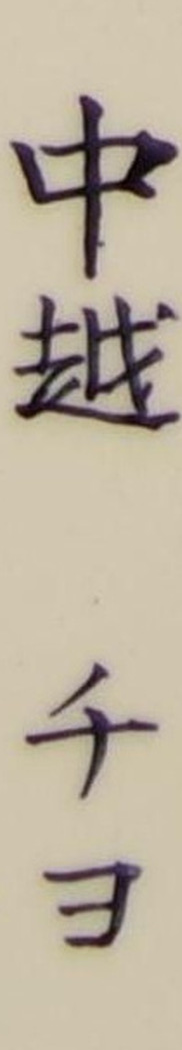中越チヨ
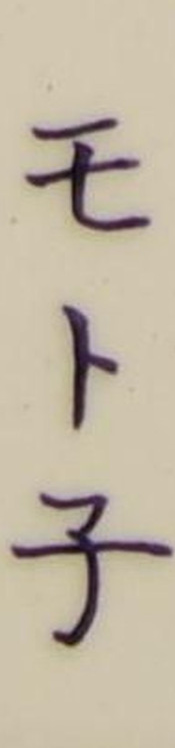モト子
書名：A~D
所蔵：koyasan kongobuji
